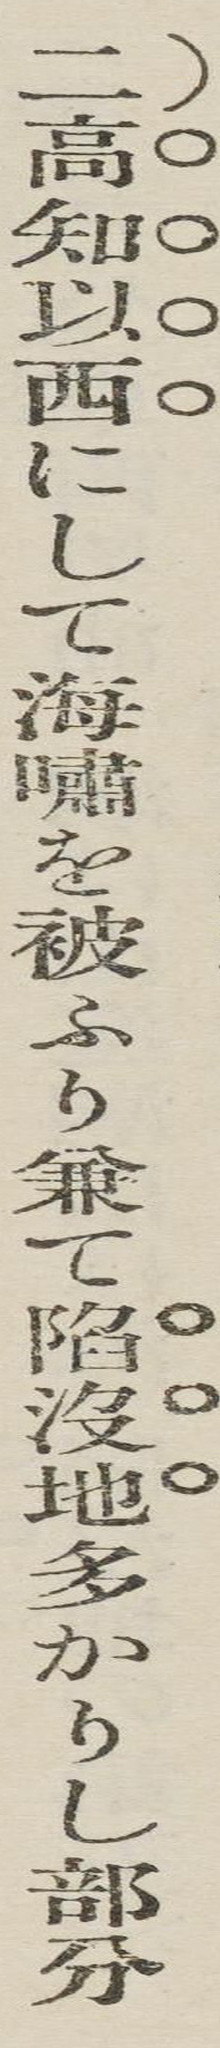㈡高知以西にして海嘯を被ふり兼て陥没多かりし部分
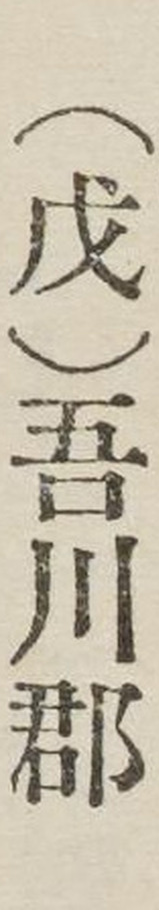吾川郡
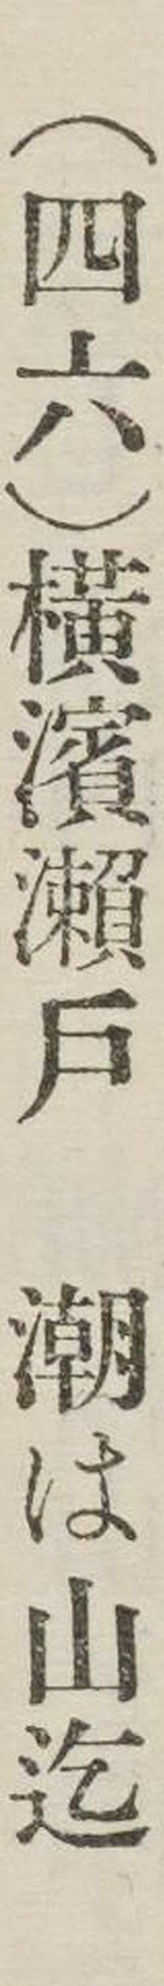横濱瀬戸潮は山迄
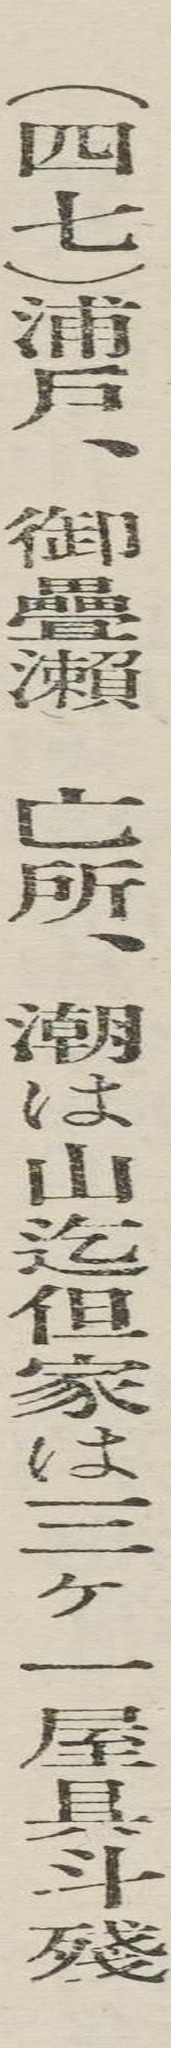浦戸、御畳瀬亡所、潮は山迄但家は三ヶ一屋具斗残
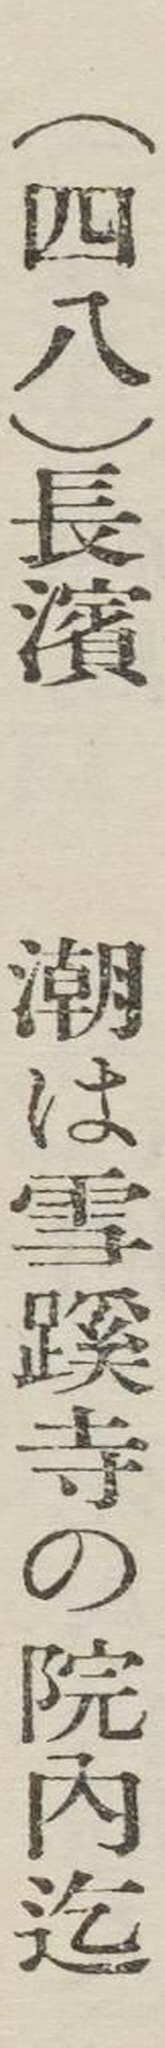長濱潮は雪蹊寺の院内迄
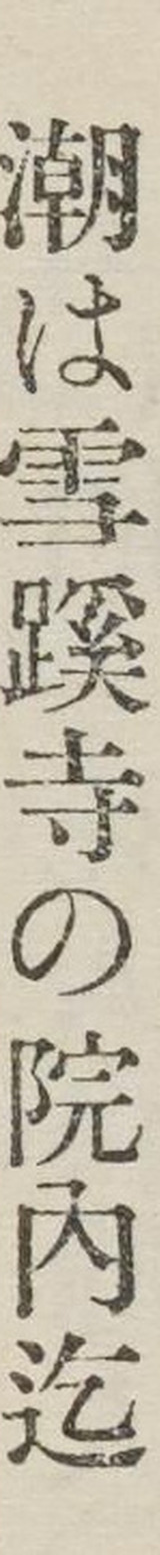長濱潮は雪蹊寺の院内迄
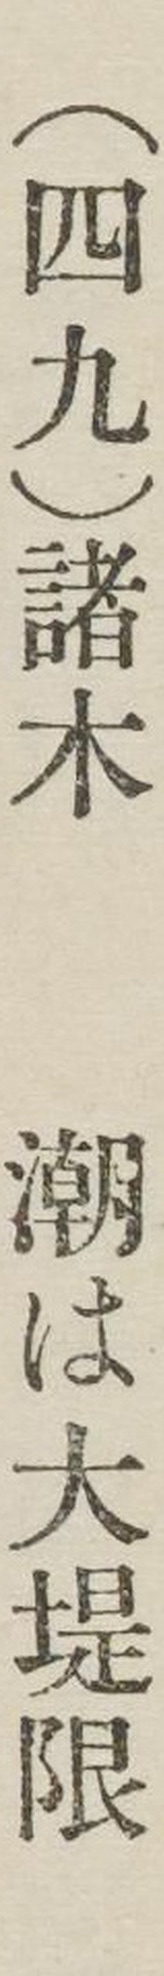諸木潮は大堤限
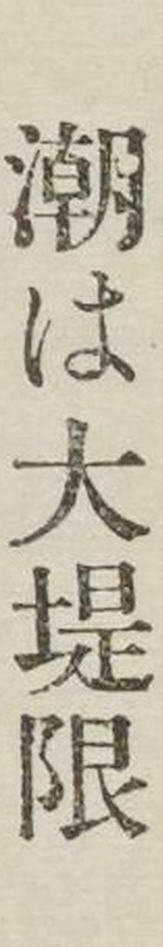諸木潮は大堤限
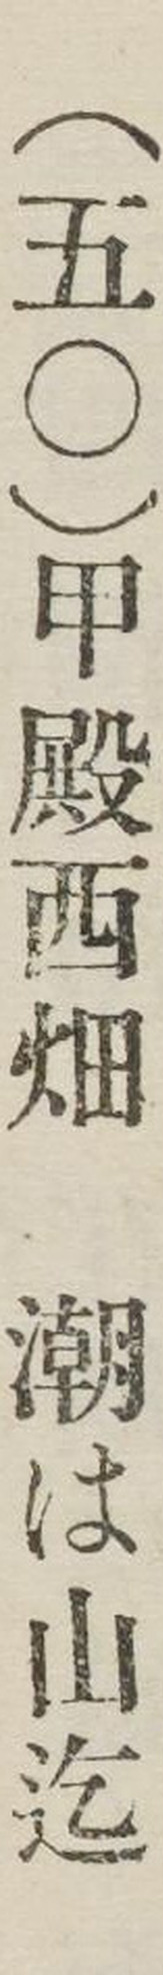甲殿西畑潮は山迄
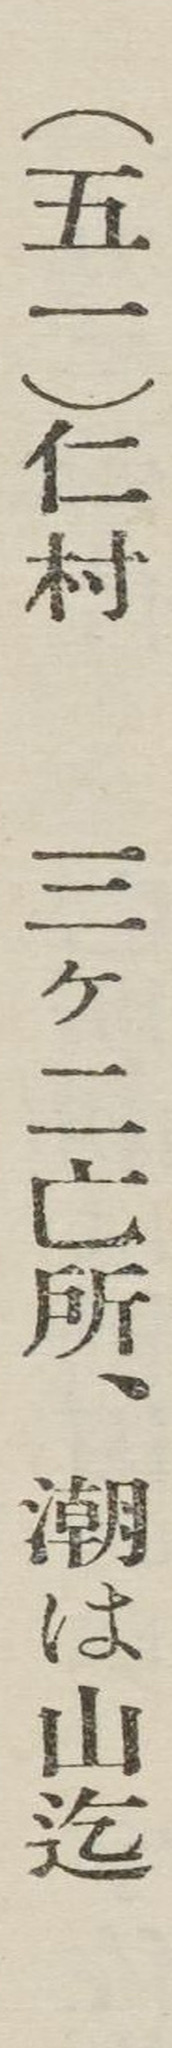仁村三ヶ二亡所、潮は山迄
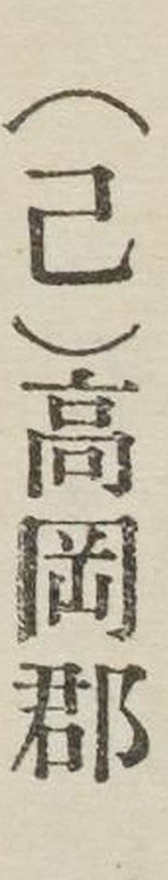高岡郡

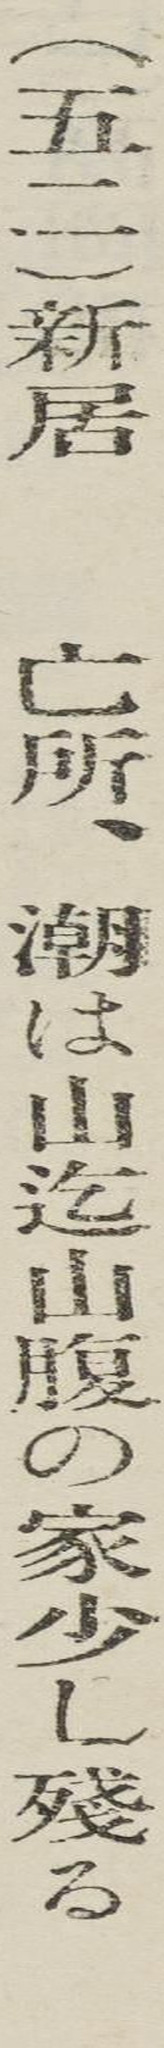新居亡所、潮は山迄山腹の家少し残る
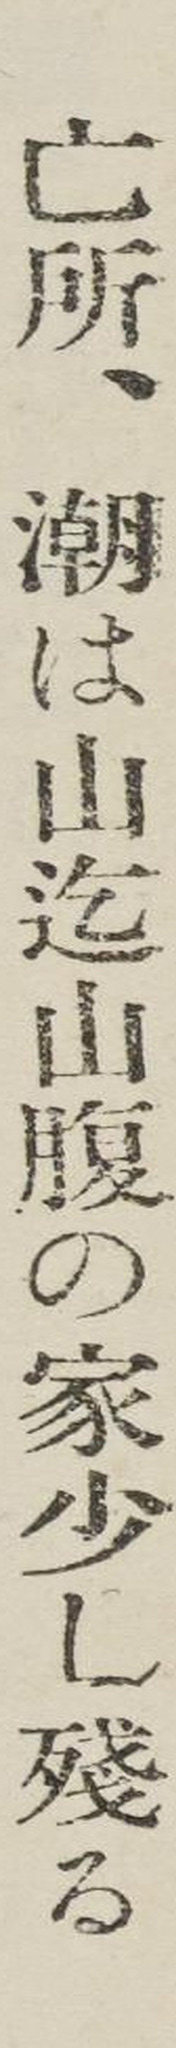新居亡所、潮は山迄山腹の家少し残る
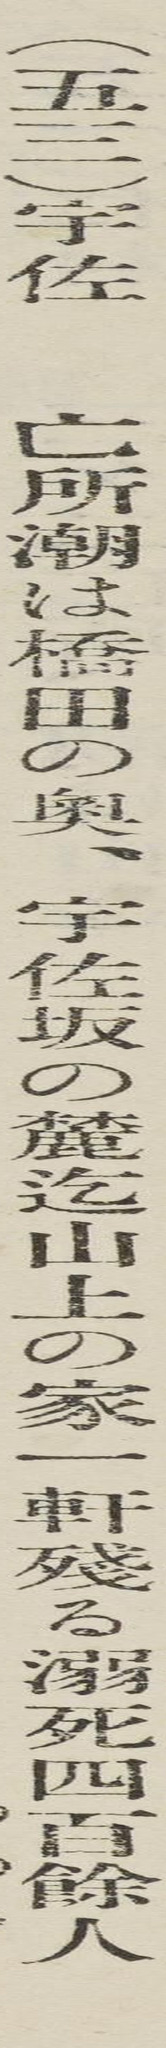宇佐亡所潮は橋田の奥、宇佐坂の麓迄山上の家一軒残る溺死四百余人
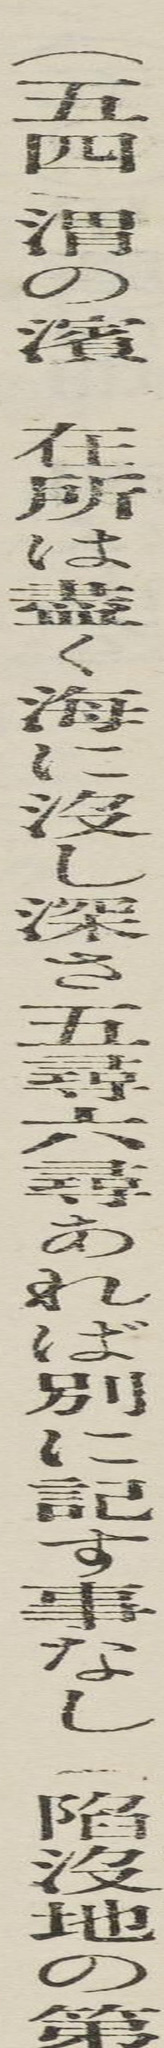渭の浜在所は尽く海に没し深さ五尋六尋あれば別に記載す事なしの第
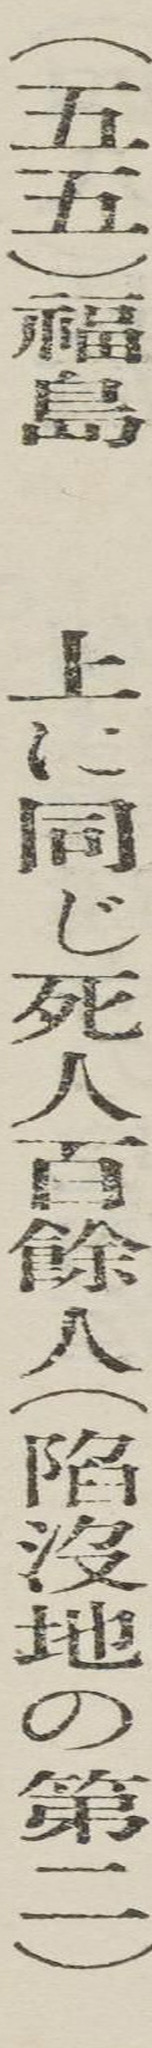福島上に同じ死人百余人の第二）
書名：土佐古今ノ地震
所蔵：東京大学地震研究所図書室 Earthquake Research Institute Library, The University of Tokyo, JAPAN
